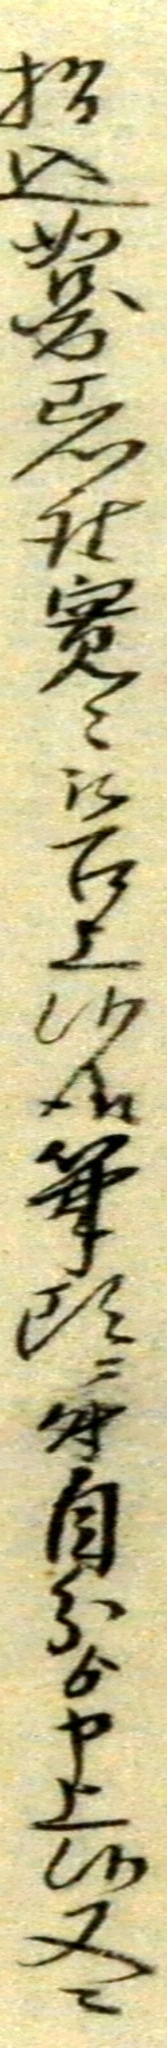指込如図着座寛々被召上候様筆頭ニ付自分ゟ申上候又々
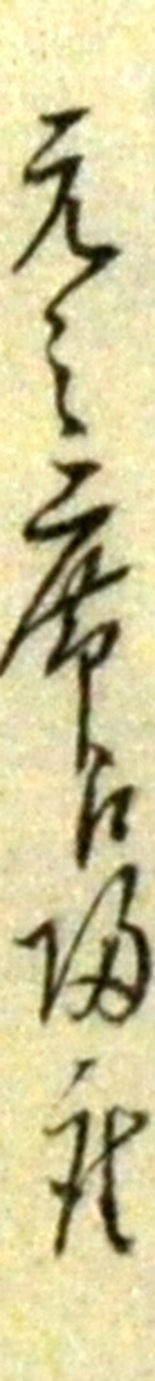元之席え帰座
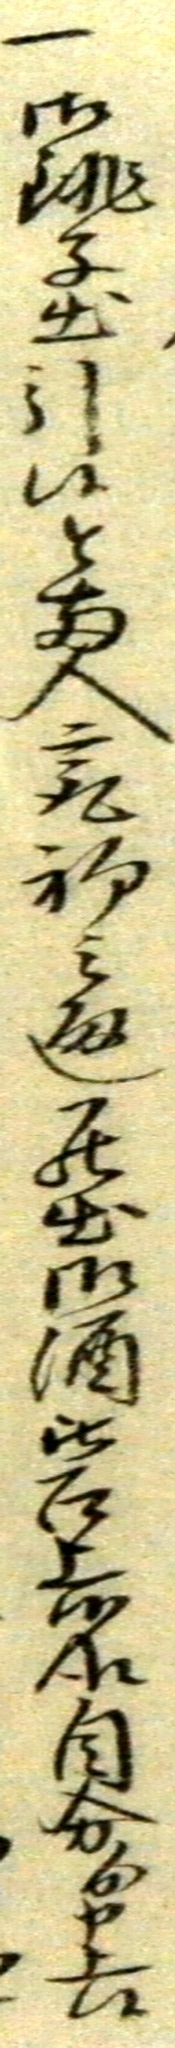一御銚子出引候と両人宛初之通罷出御酒被召上候様自分ゟ申上候
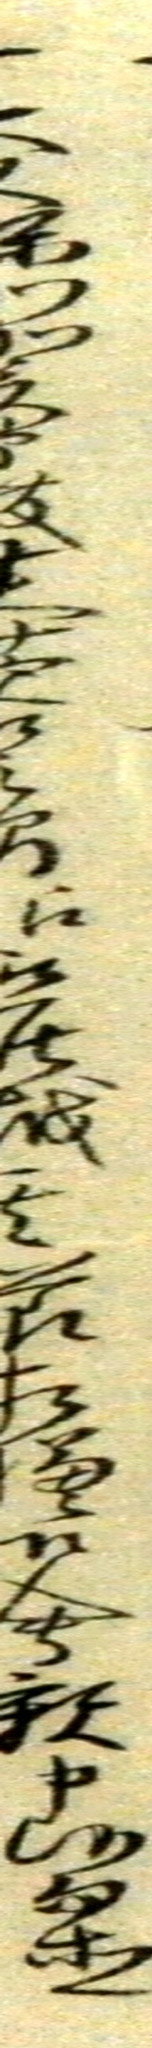一大久保加賀守殿芙蓉之間え被罷越其節相模御會釈申候而直

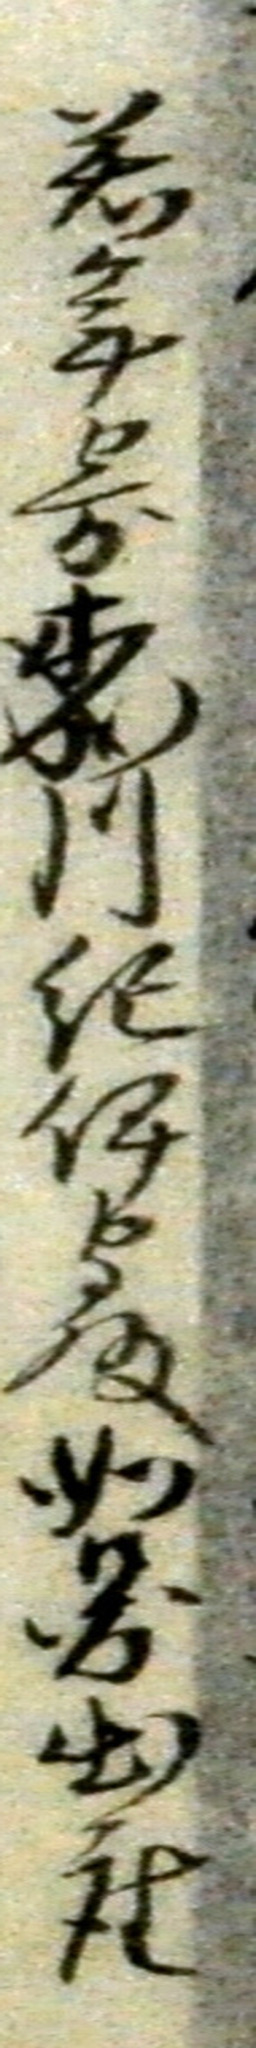若年寄森川紀伊守殿如圖出座
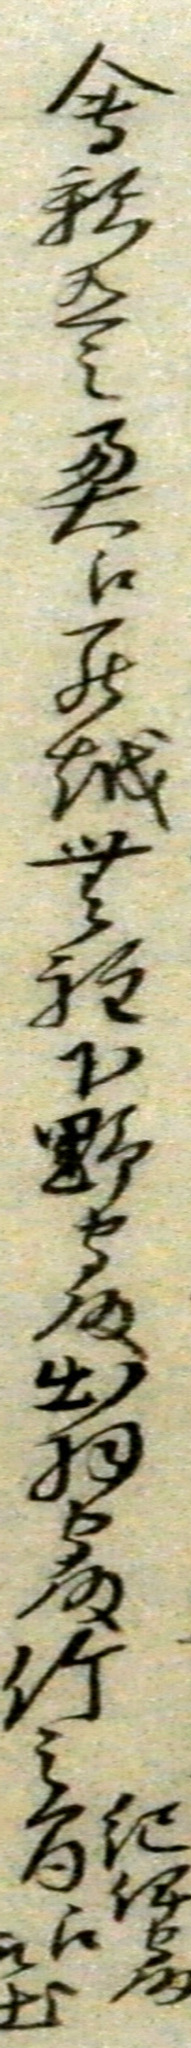會釈有之奥え罷越無程下野守殿出羽守殿竹之間え被出
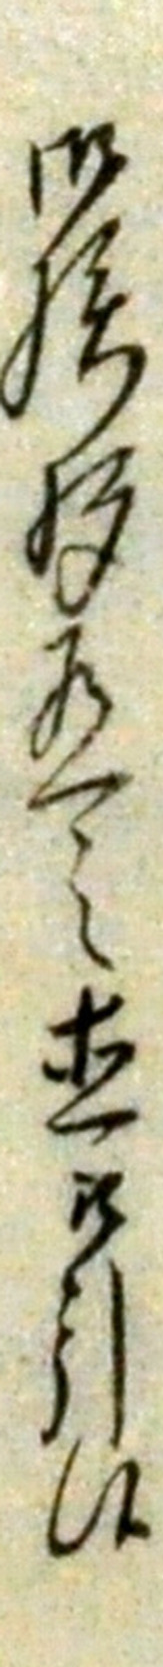御挨拶有之直被引候
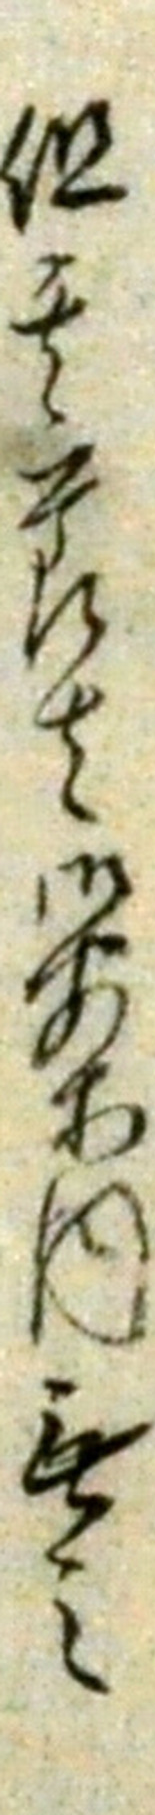但其節は御案内無之
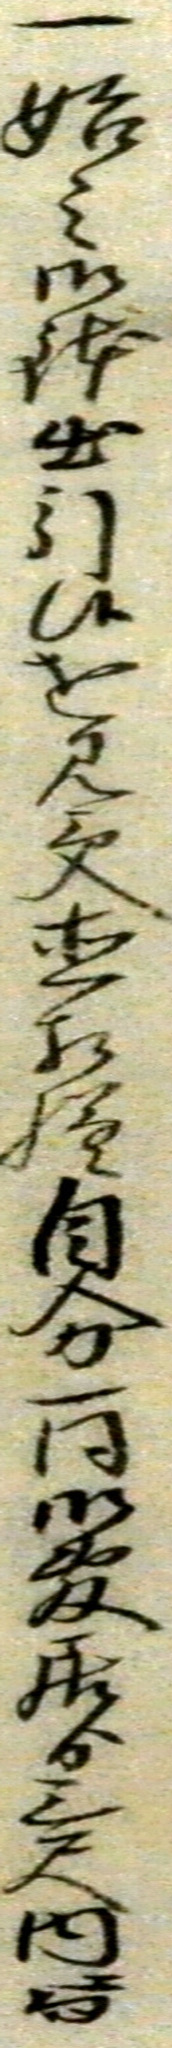一始之御鉢出引候を見受直相模自分一同御敷居ゟ三尺内ニ而
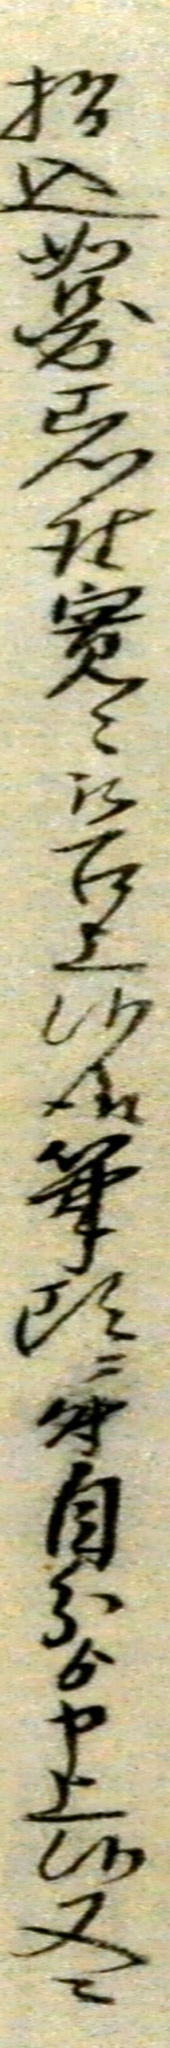指込如図着座寛々被召上候様筆頭ニ付自分ゟ申上候又々
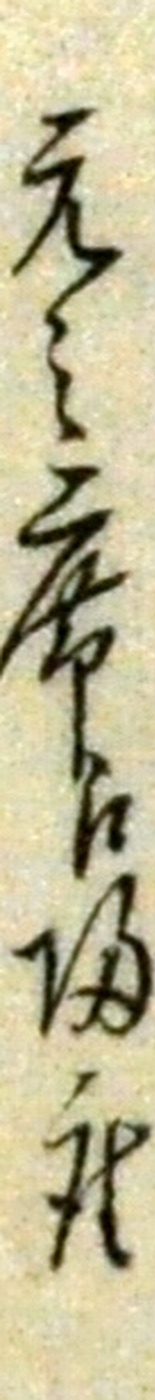元之席え帰座
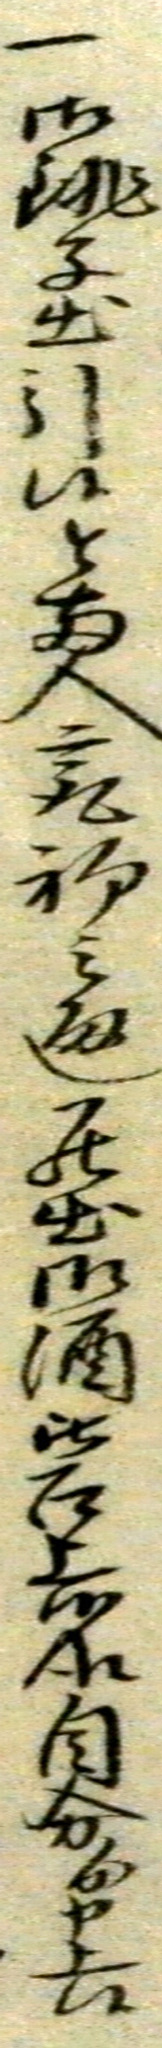一御銚子出引候と両人宛初之通罷出御酒被召上候様自分ゟ申上候
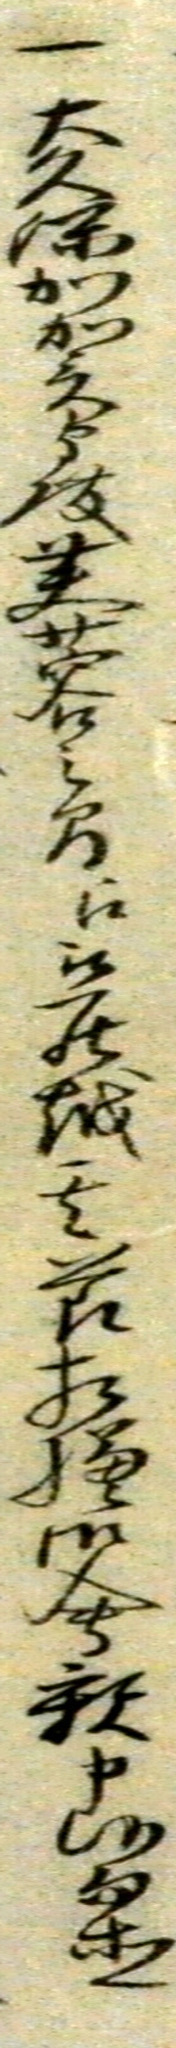一大久保加賀守殿芙蓉之間え被罷越其節相模御會釈申候而直
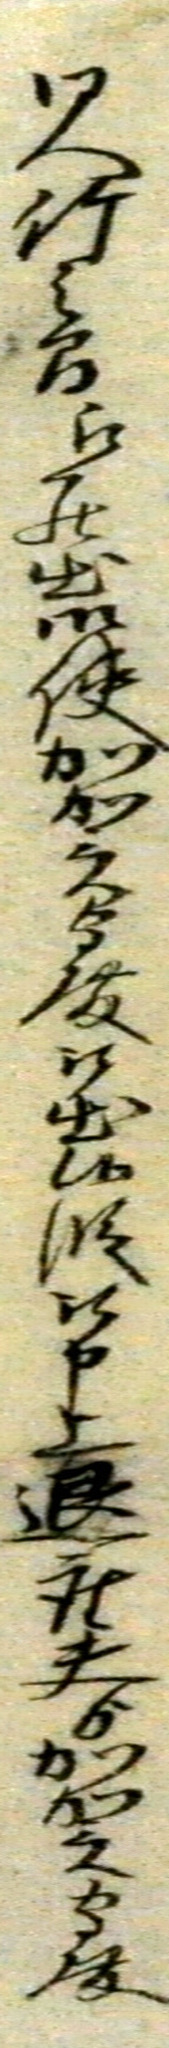同人竹之間え罷出御使加賀守殿被出候段被申上退座夫ゟ加賀守殿
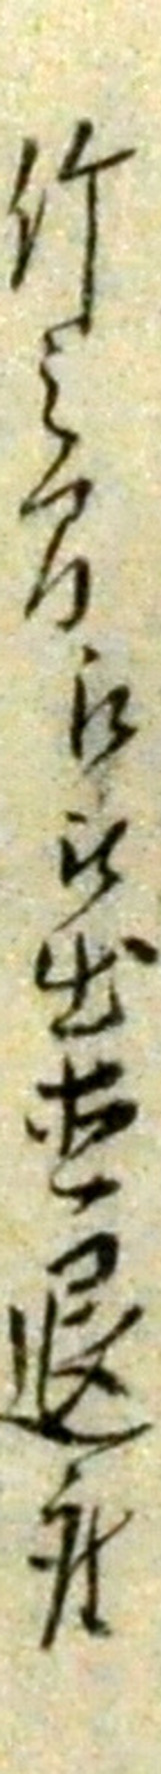竹之間え被出直退座
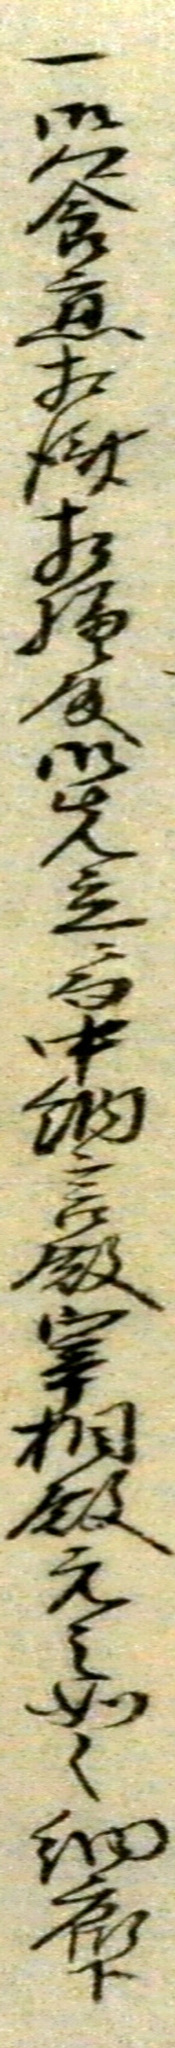一御饗應相済相模殿御先立ニ而中納言殿宰相殿元之如く細廊下
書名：竹ノ間御座席奉行勤方控外
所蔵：伊那市立高遠町図書館・合同会社AMANE
